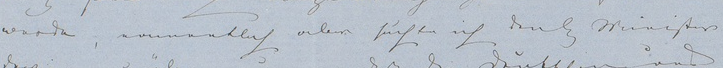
werde, namentlich aber suchte ich den Herrn Minister
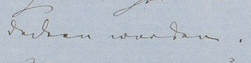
decken werden.
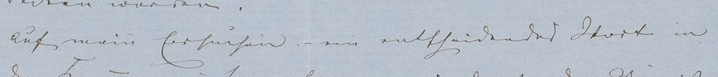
Auf mein Ersuchen – ein entscheidendes Wort in
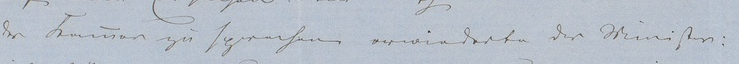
der Kammer zu sprechen erwiederte der Minister:
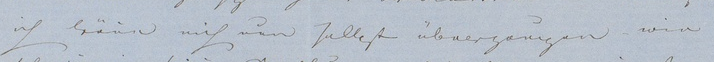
«ich könne mich nun selbst überzeugen – wie
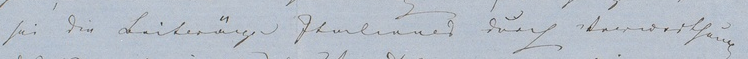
sei die Beiträge Italiens durch Verwerthung
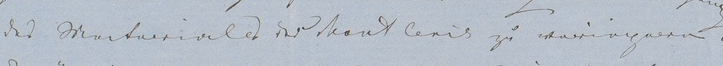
des Materials des Mont Cenis zu veringern
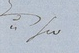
usw.»
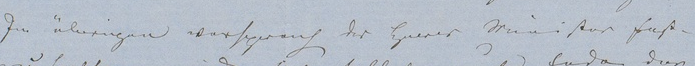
Im übrigen versprach der Herr Minister fest-
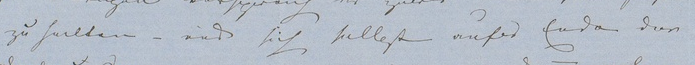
zuhalten – und sich selbst aufs Ende der
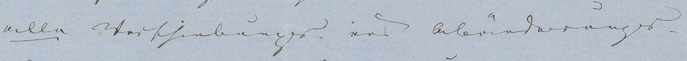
alle Verschiebungs- und Abänderungs-
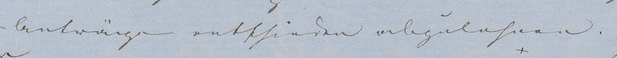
Anträge entschieden abzulehnen. –
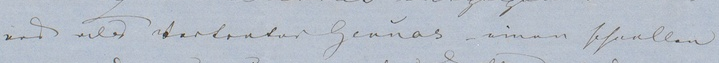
und als Vertreter Genuas – einen schnellen
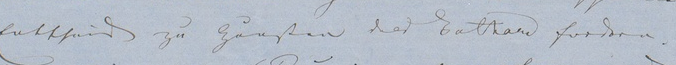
Entscheid zu Gunsten des Gothard fordern.
